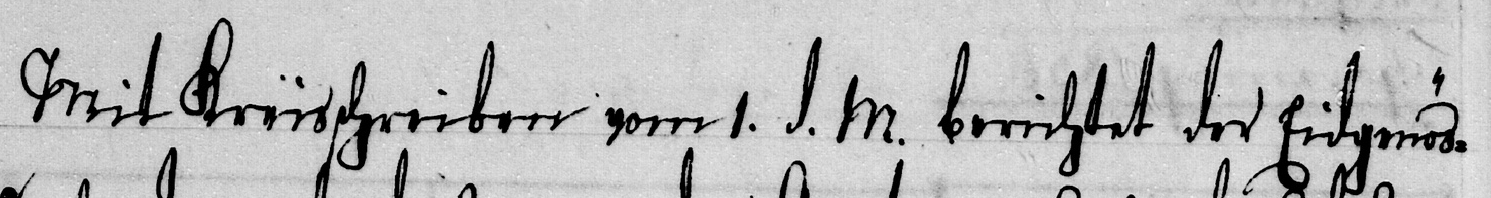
Mit Kreisschreiben vom 1. d. Ms. berichtet der Eidgenö¬
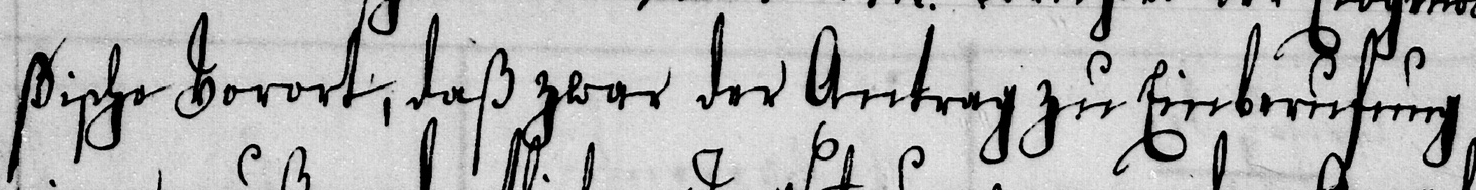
ßische Vorort, daß zwar der Antrag zu Einberufung
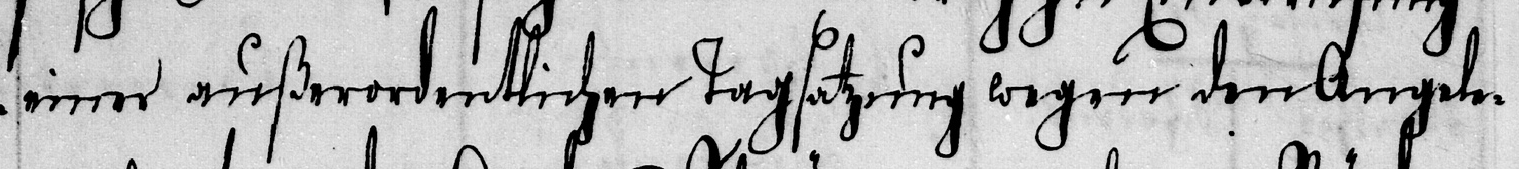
einer außerordentlichen Tagsatzung wegen den Angele¬
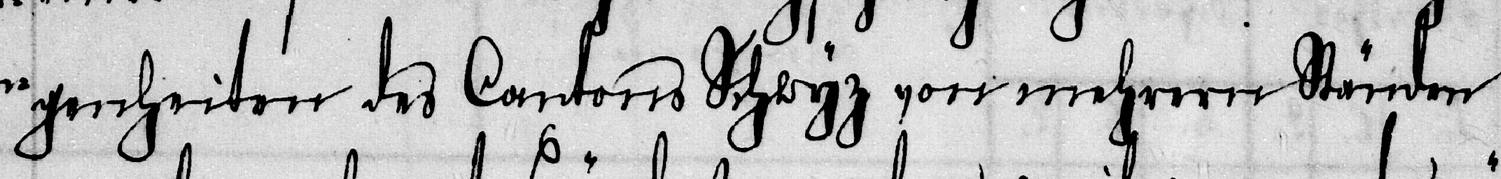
genheiten des Cantons Schwyz von mehrern Ständen
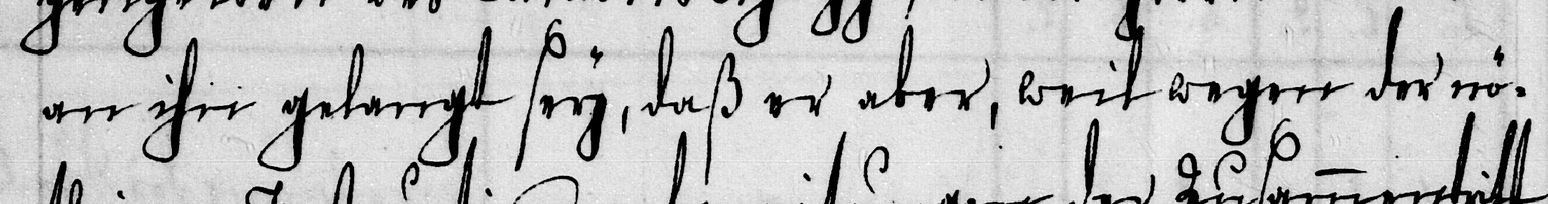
an ihn gelangt sey, daß er aber, weil wegen der nö¬
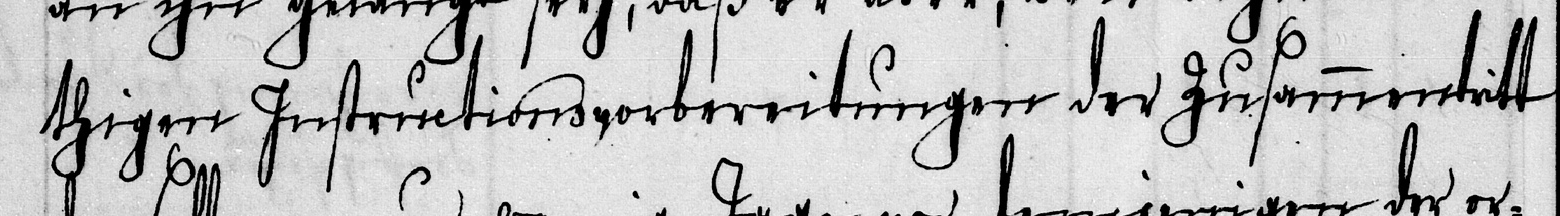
thigen Instructionsvorbereitungen der Zusammentritt
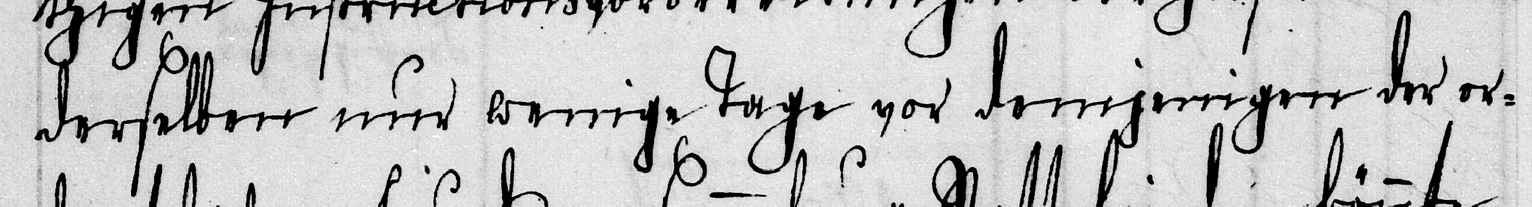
derselben nur wenige Tage vor demjenigen der or¬
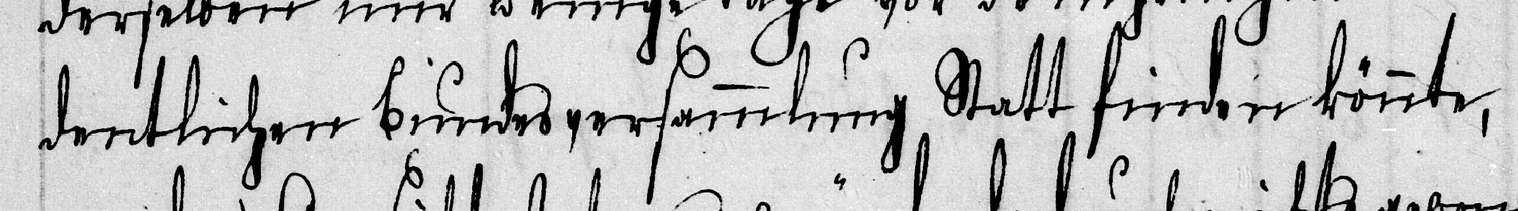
dentlichen Bundesversammlung Statt finden könnte,
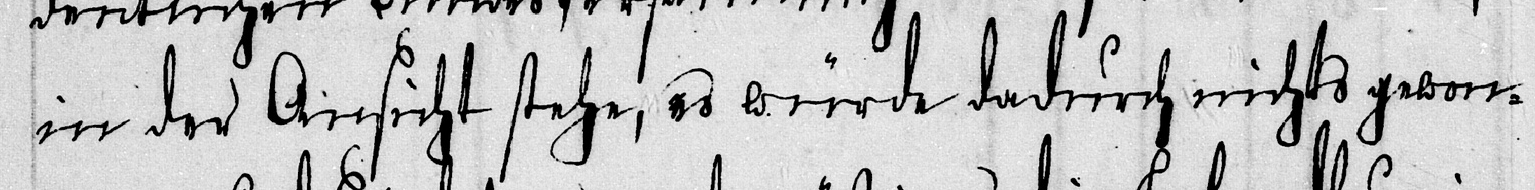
in der Ansicht stehe, es würde dadurch nichts gewon¬
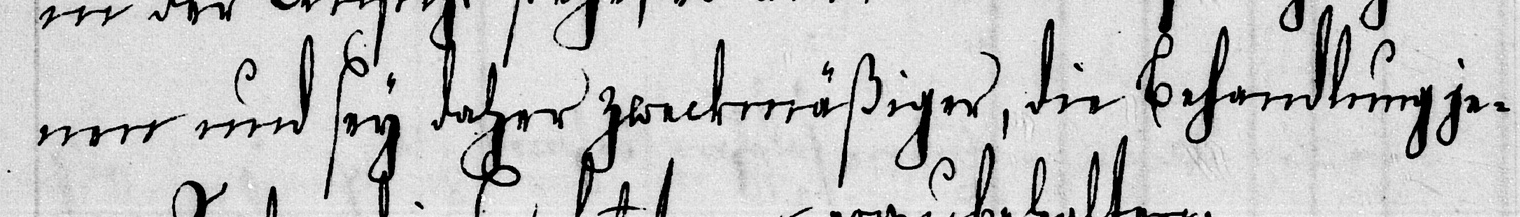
nen und sey daher zweckmäßiger, die Behandlung je¬
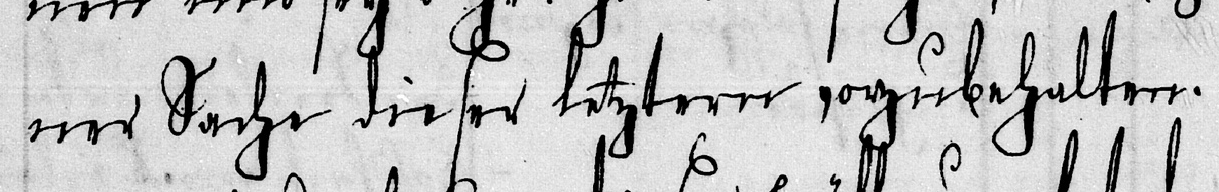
ner Sache dieser letztern vorzubehalten.
